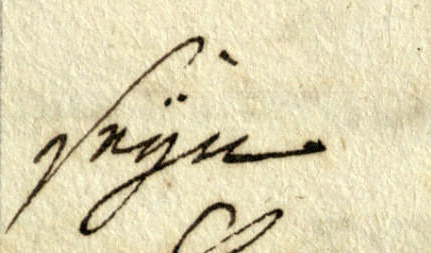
seÿn.
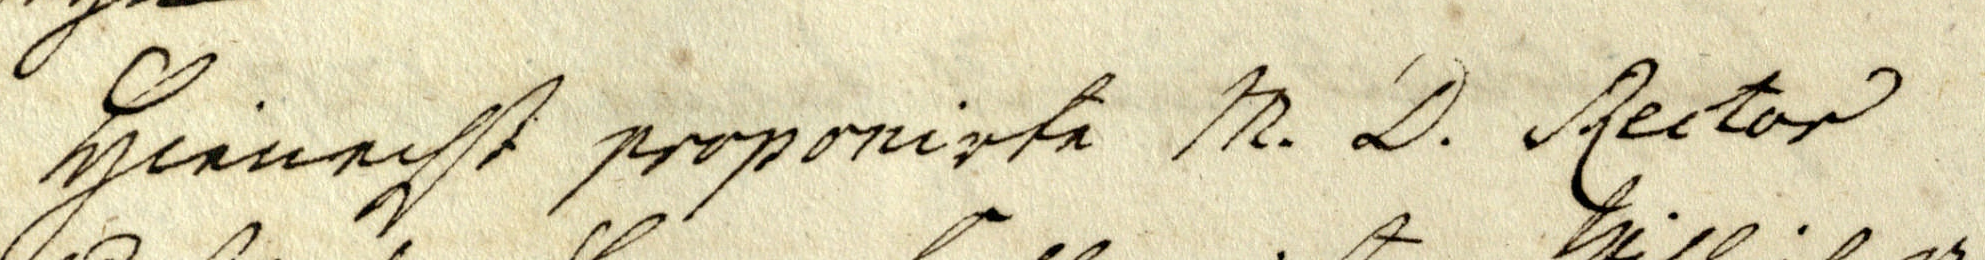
Hienechst proponirte M. D. Rector
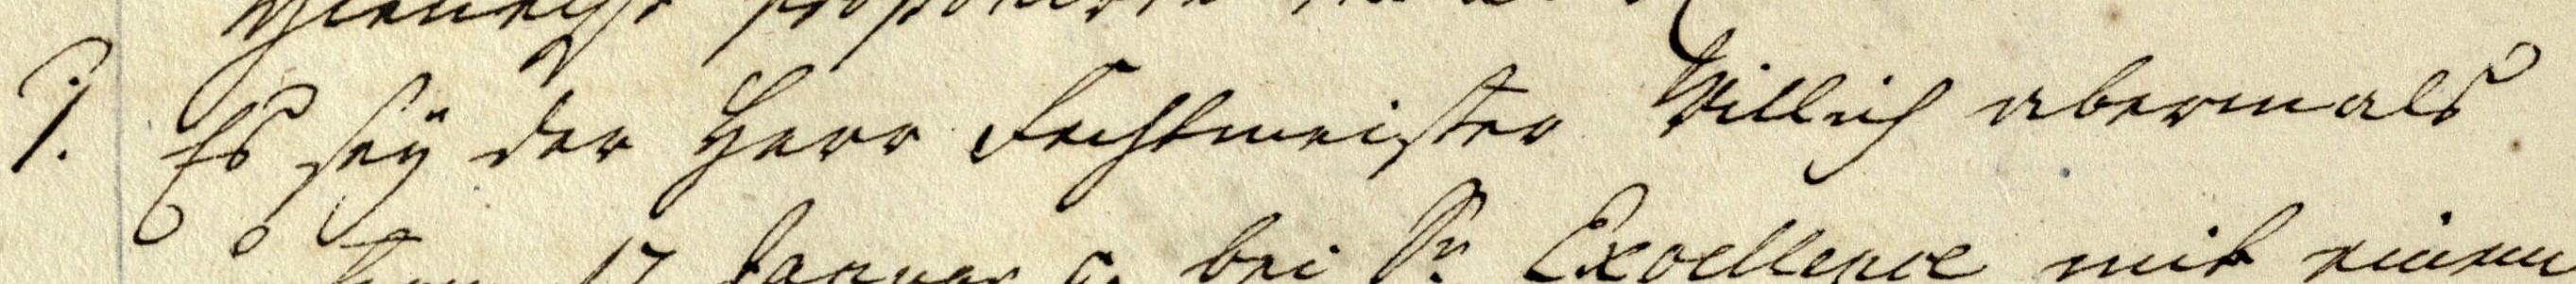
1. Es seÿ der Herr Fechtmeister Willich abermals
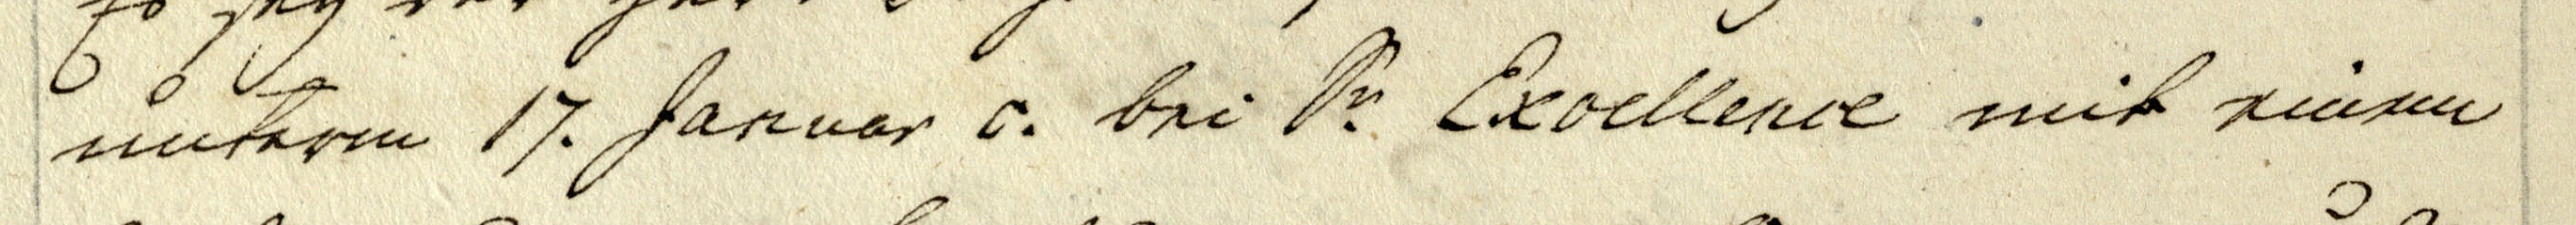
unterm 17. Januar c. bei Sr Excellence mit einem
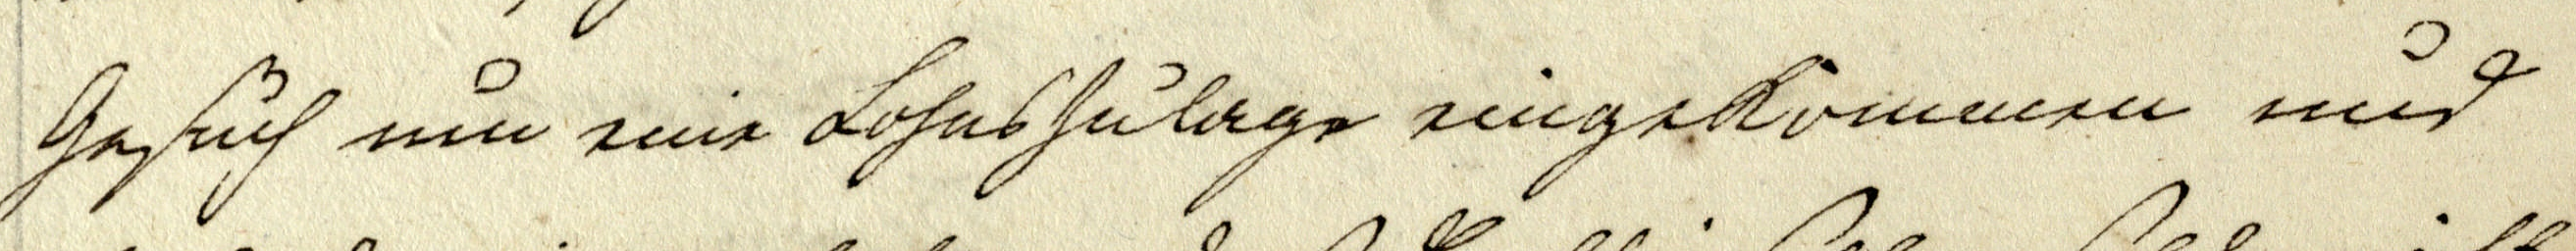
Gesuch um eine Lohnszulage eingekommen und
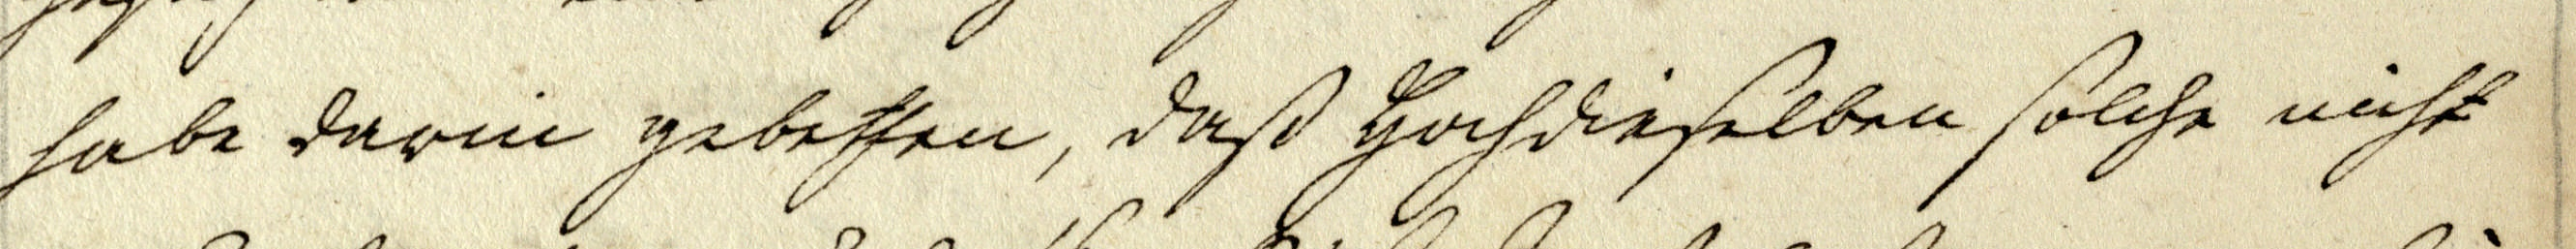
habe darin gebethen, daß Hochdieselben solche nicht
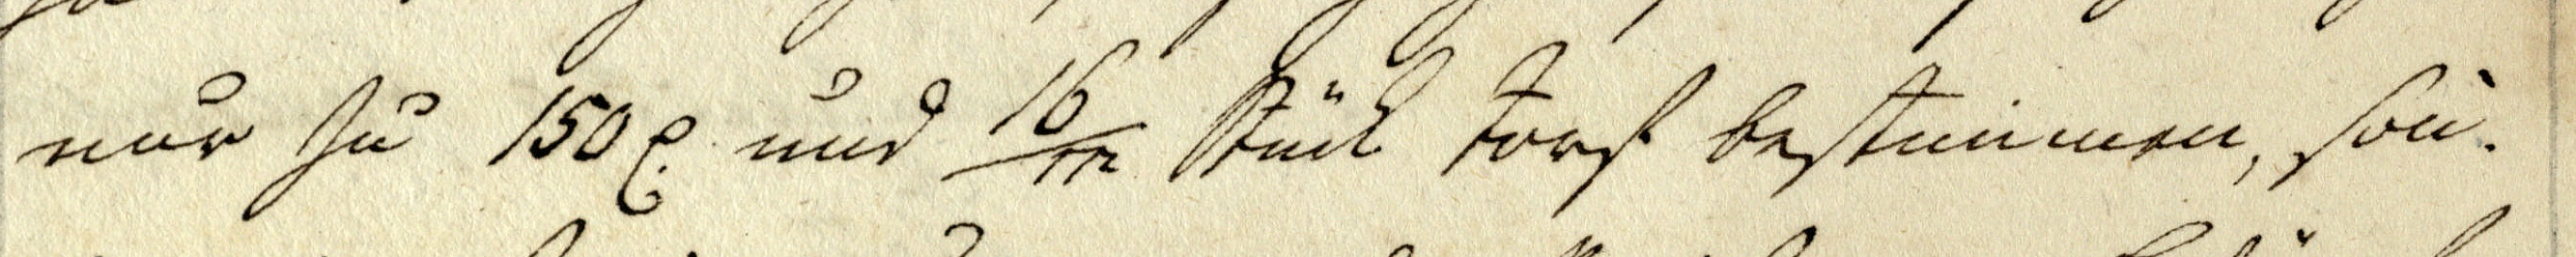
nur zu 150 l. und 16/m Stück Torf bestimmen, son¬
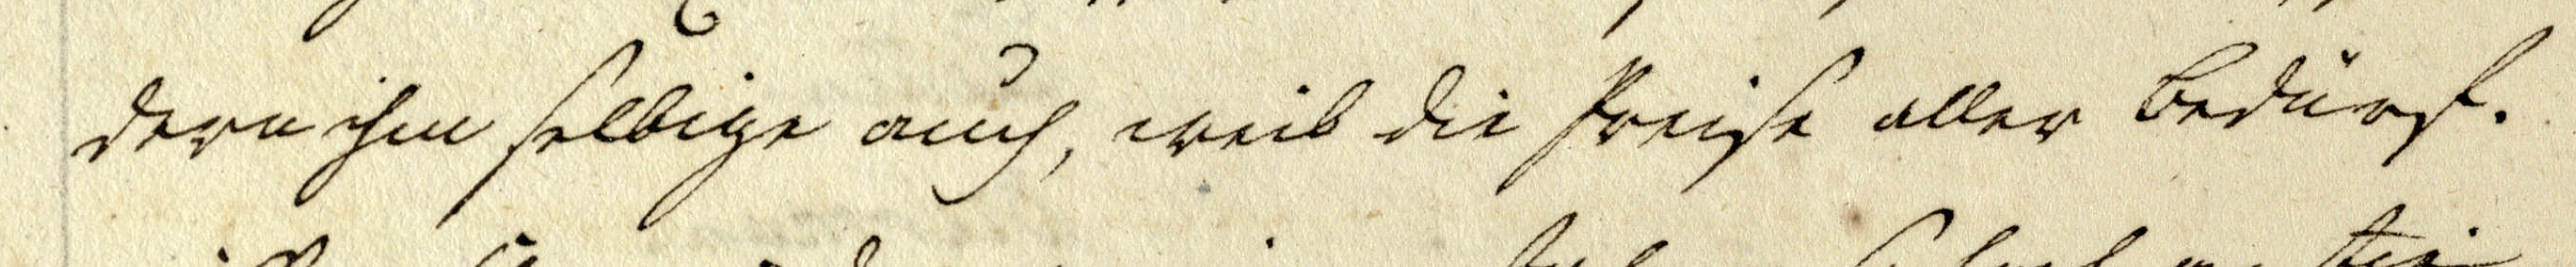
dern ihm selbige auch, weil die Preise aller Bedürf¬
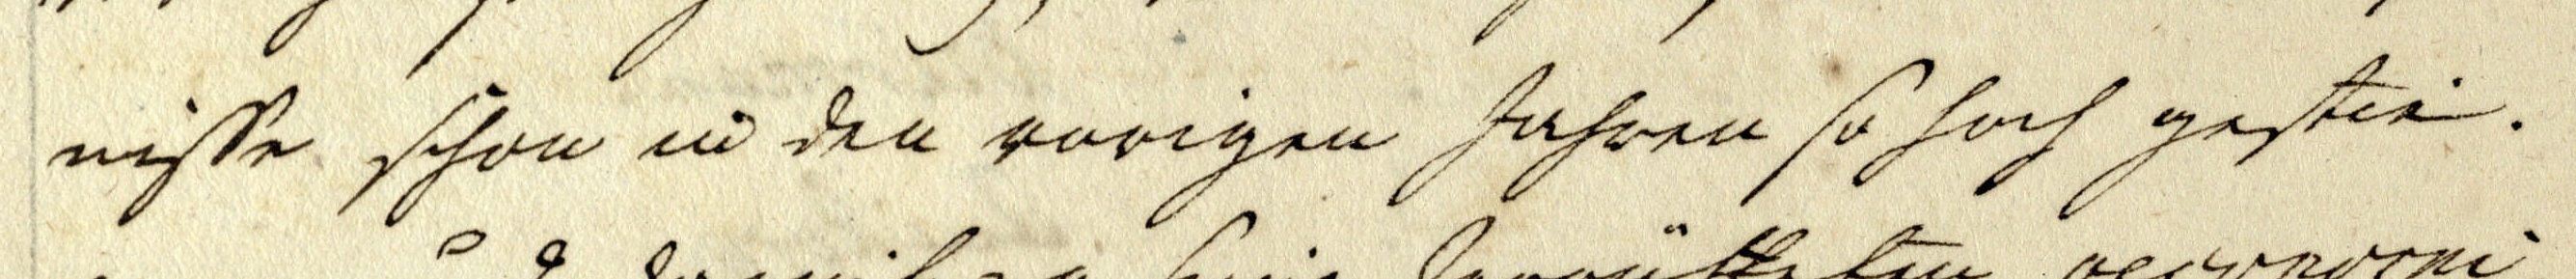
nisse schon in den vorigen Jahren so hoch gestie¬
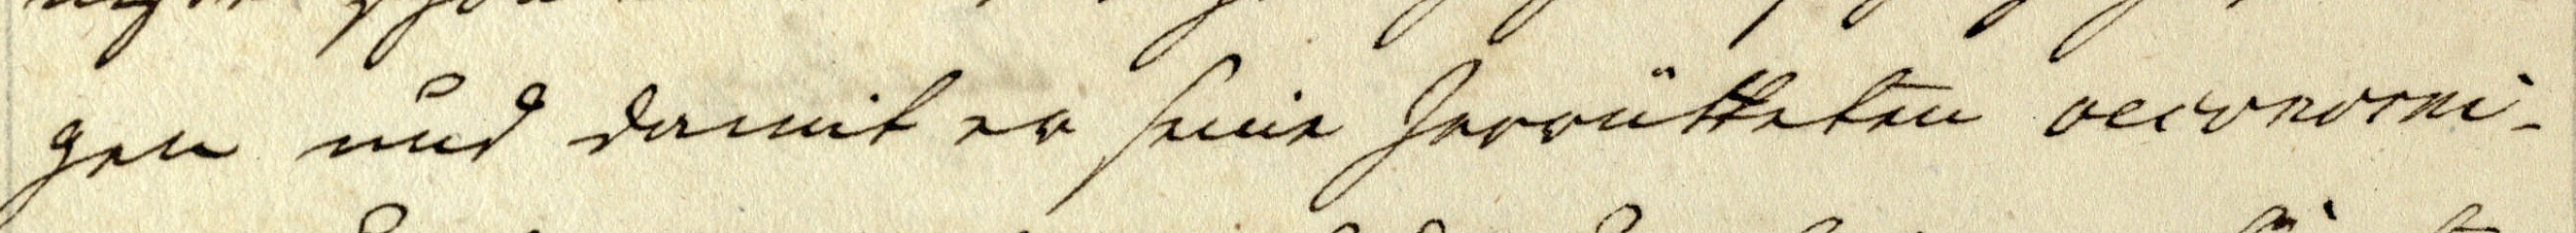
gen und damit er seine zerrütteten oeconomi¬
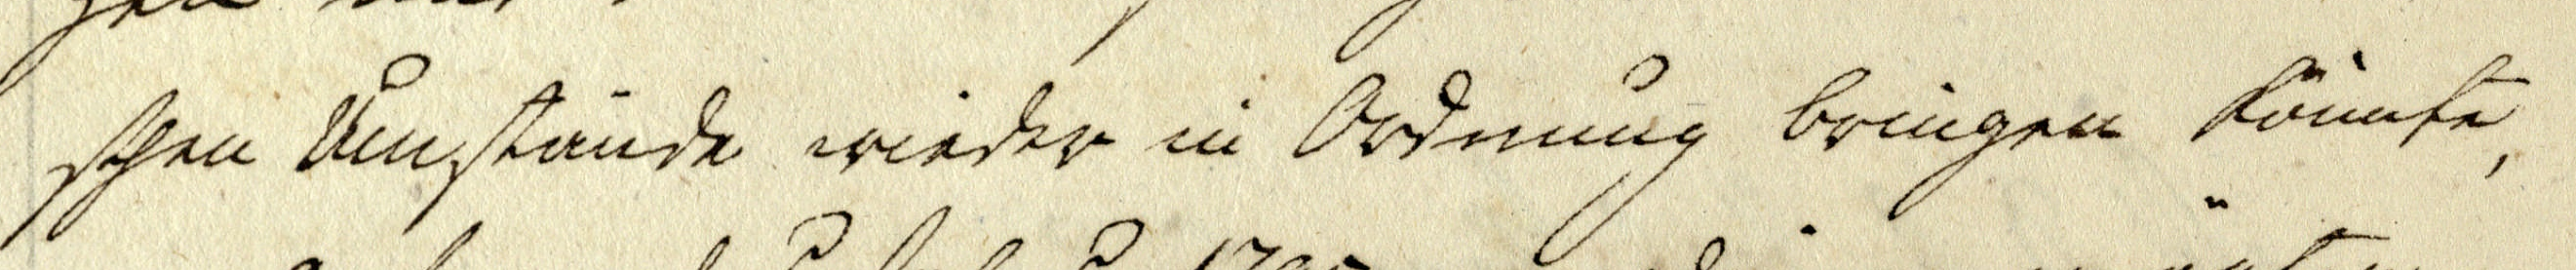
schen Umstände wieder in Ordnung bringen könnte,
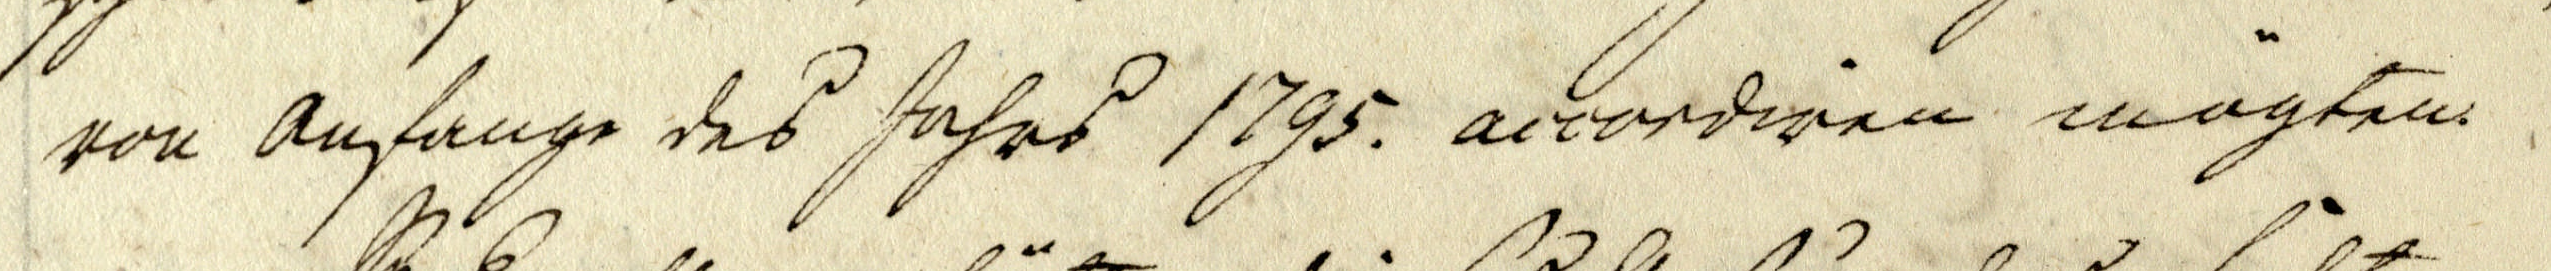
von Anfange des Jahres 1795. accordiren mögten.
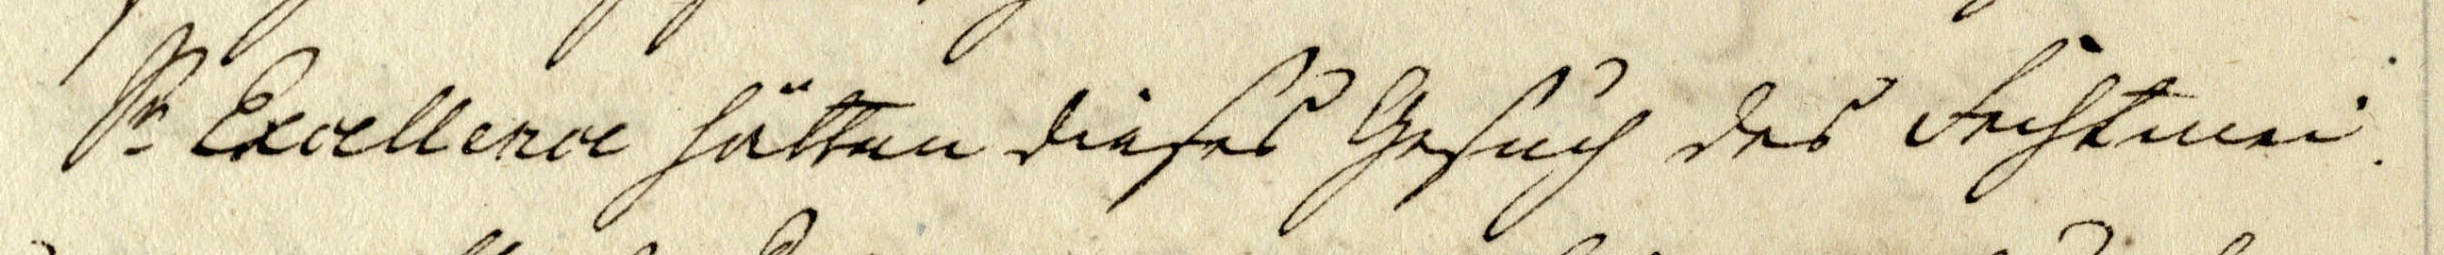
Sr Excellence hätten dieses Gesuch des Fechtmei¬
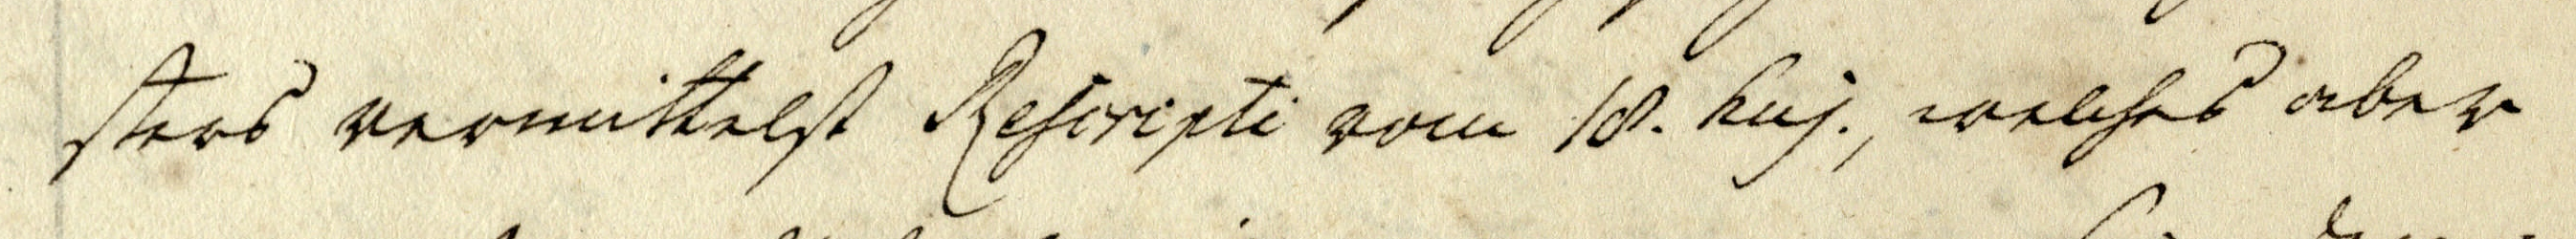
sters vermittelst Rescripti vom 18. huj., welches aber
